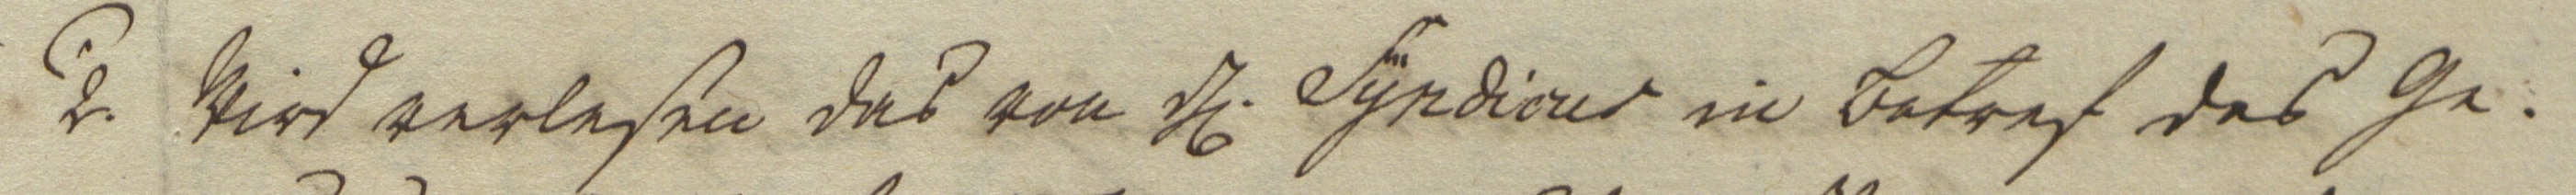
2. Wird verlesen das von dh. Syndicus in Betref des Ge¬
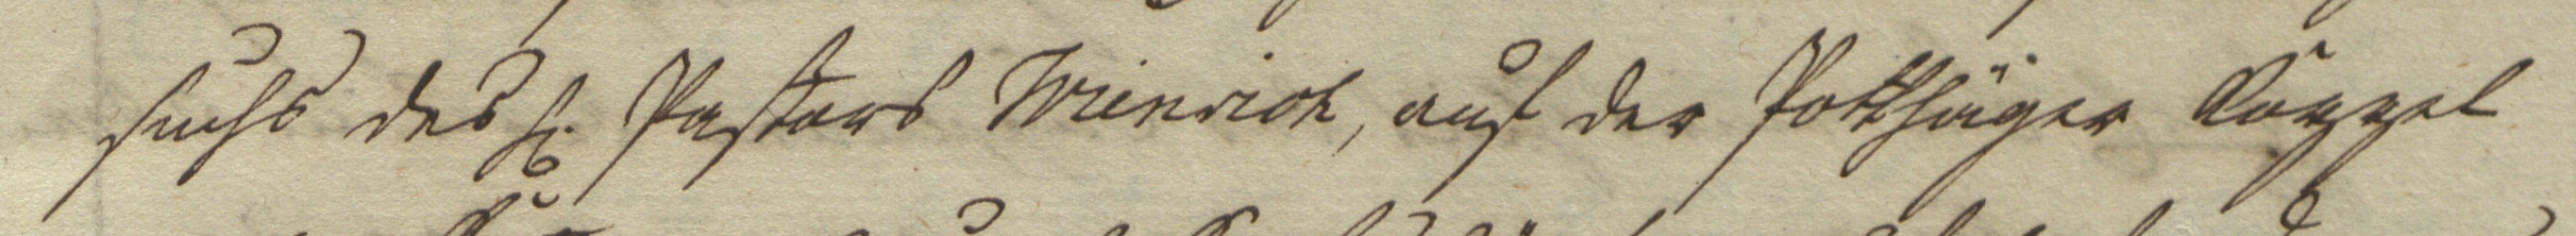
suchs des H. Pastors Wienrich, auf der Potthäger Koppel
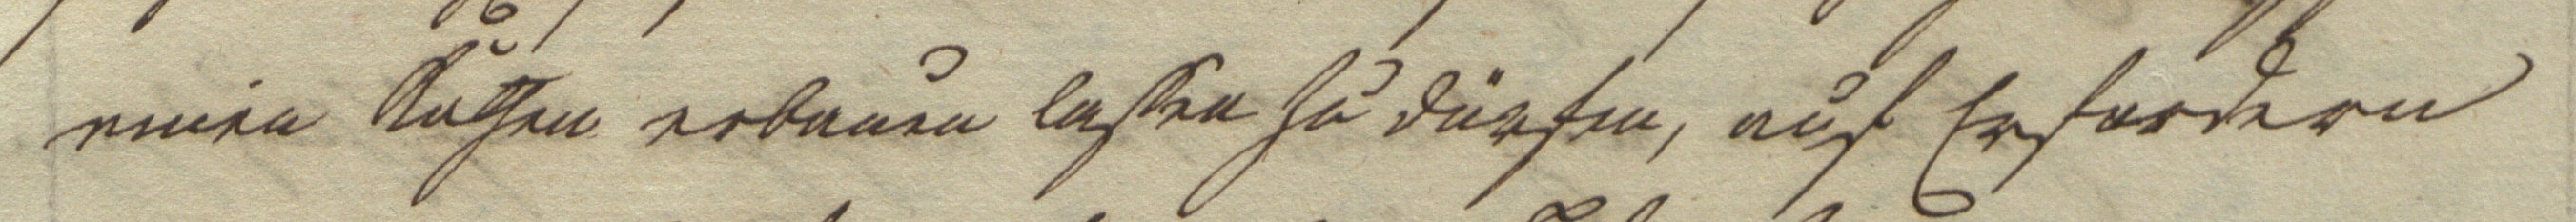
einen Kathen erbauen lassen zu dürfen, auf Erfordern
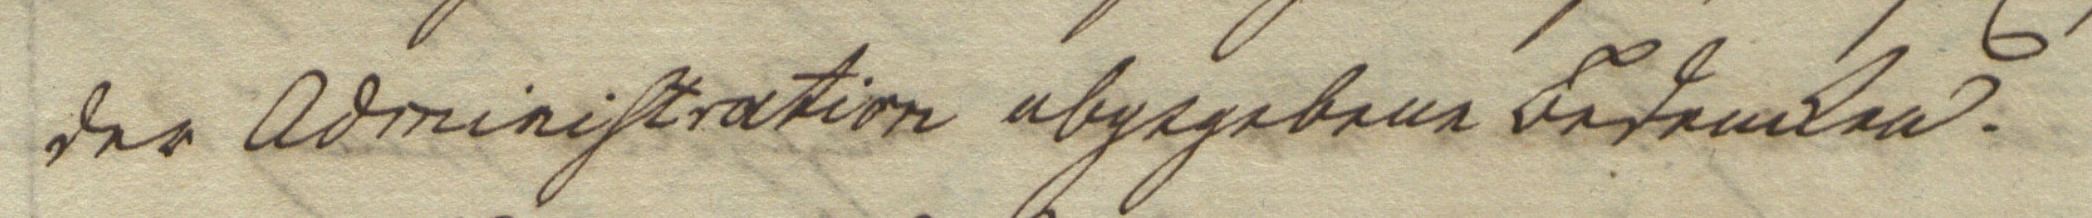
der Administration abgegebene Bedenken.
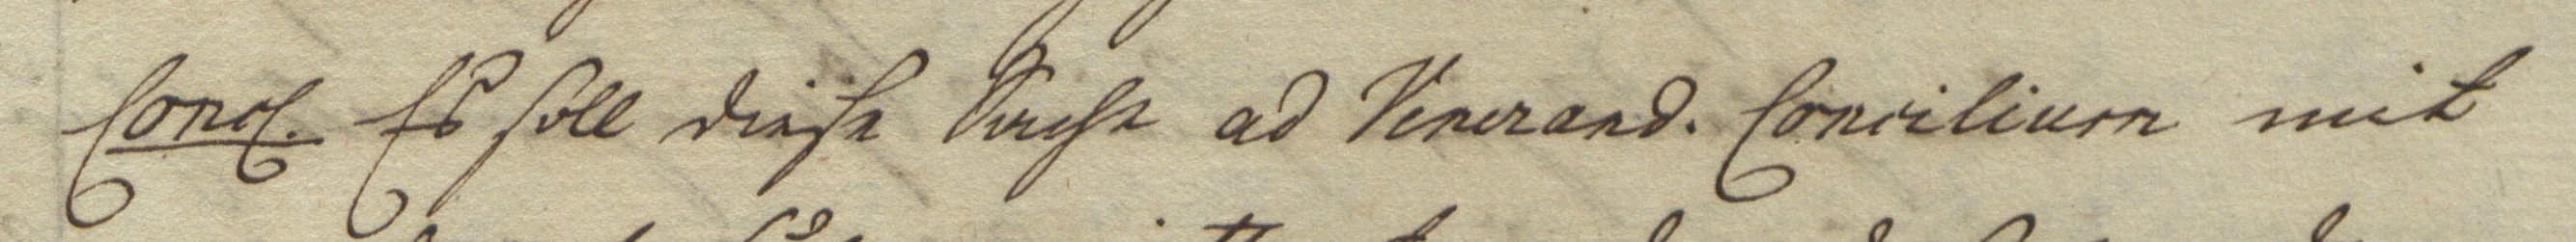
Concl. Es soll diese Sache ad Venerand. Concilium mit
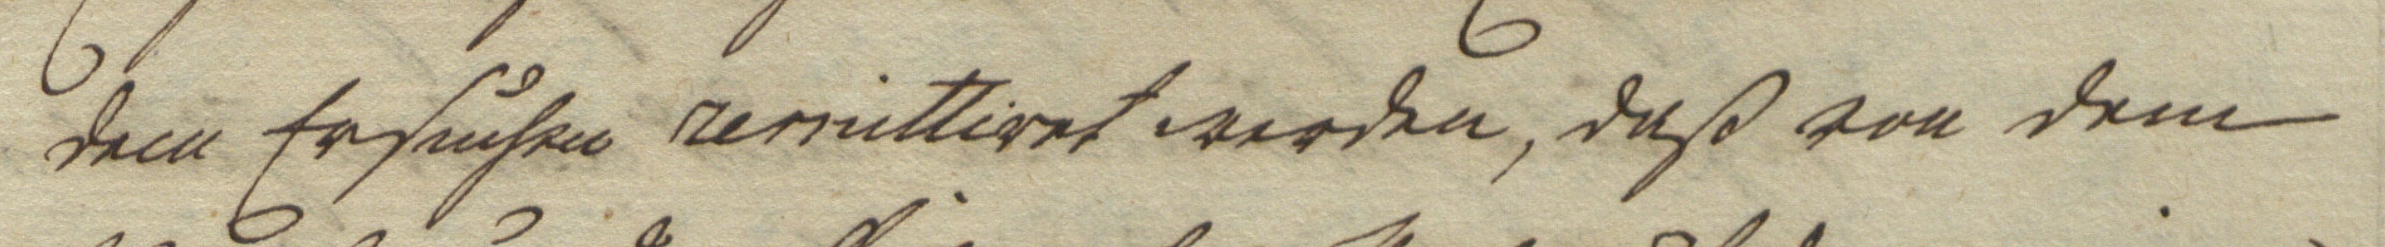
dem Ersuchen remittiret werden, daß von dem
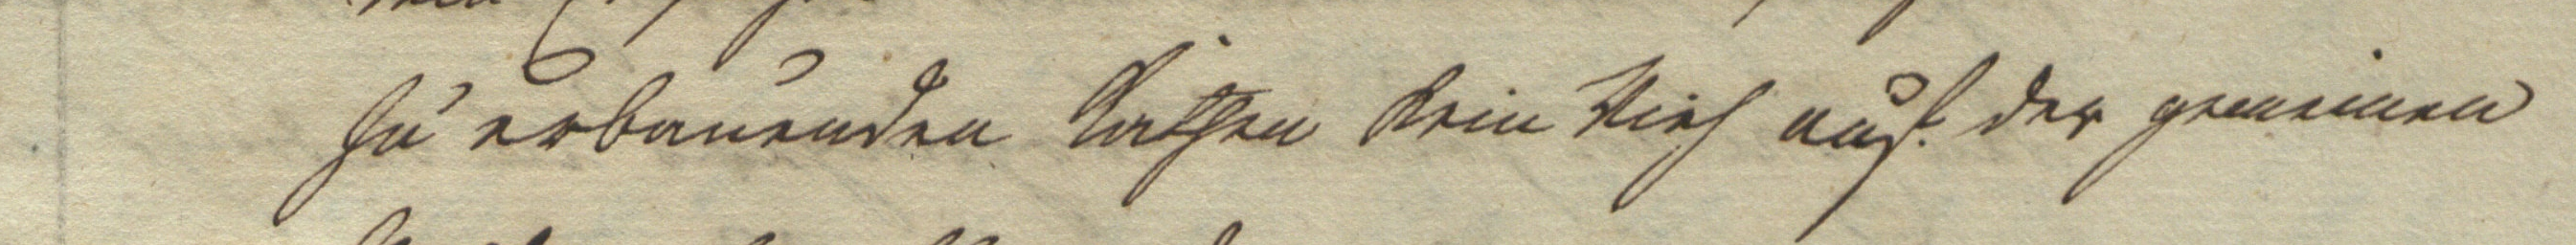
zu erbauenden Kathen kein Vieh auf der gemeinen
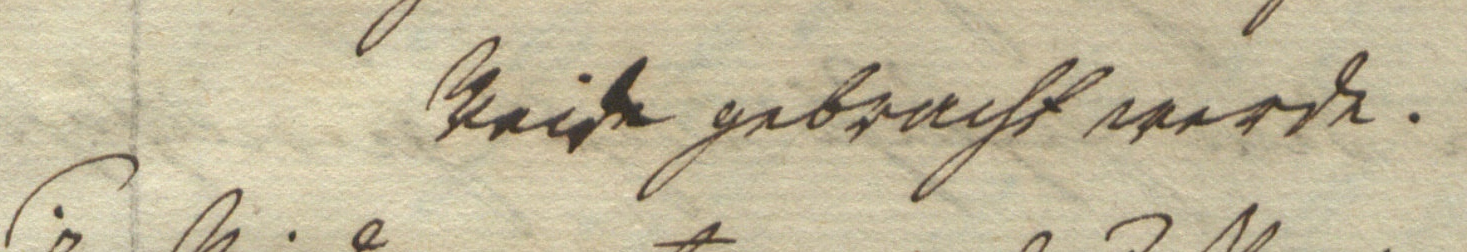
Weide gebracht werde.
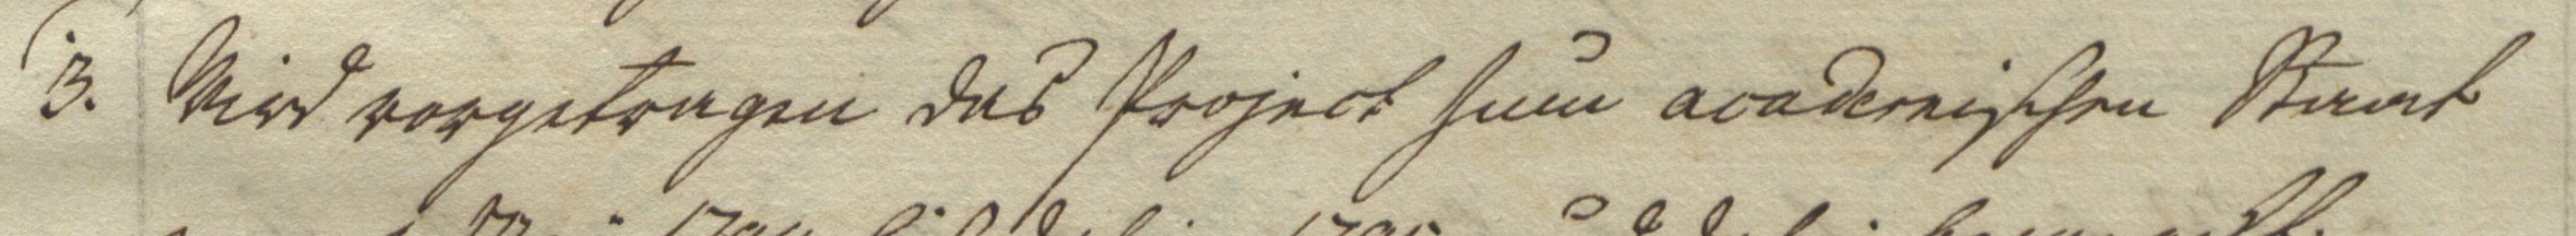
3. Wird vorgetragen das Project zum academischen Staat
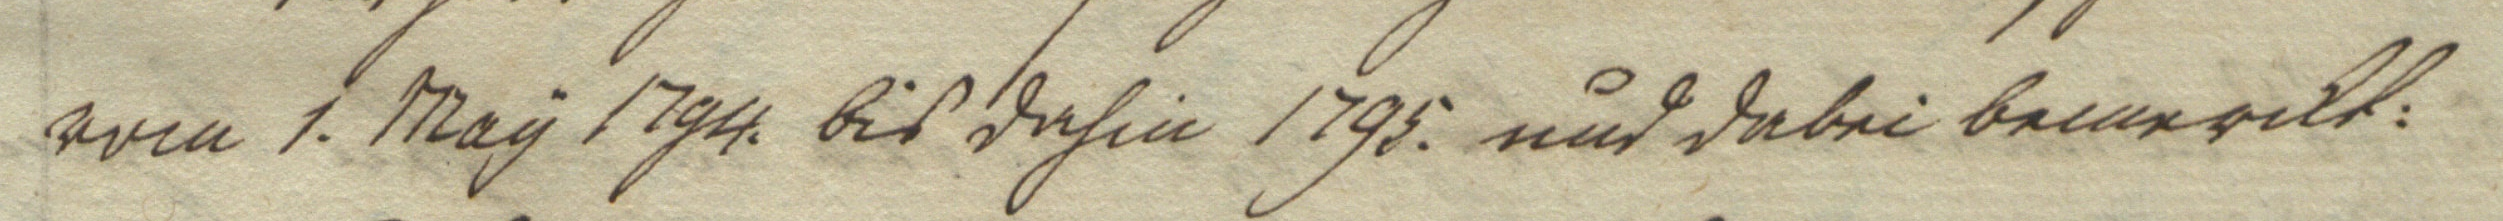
vom 1. May 1794 bis dahin 1795. und dabei bemerkt:
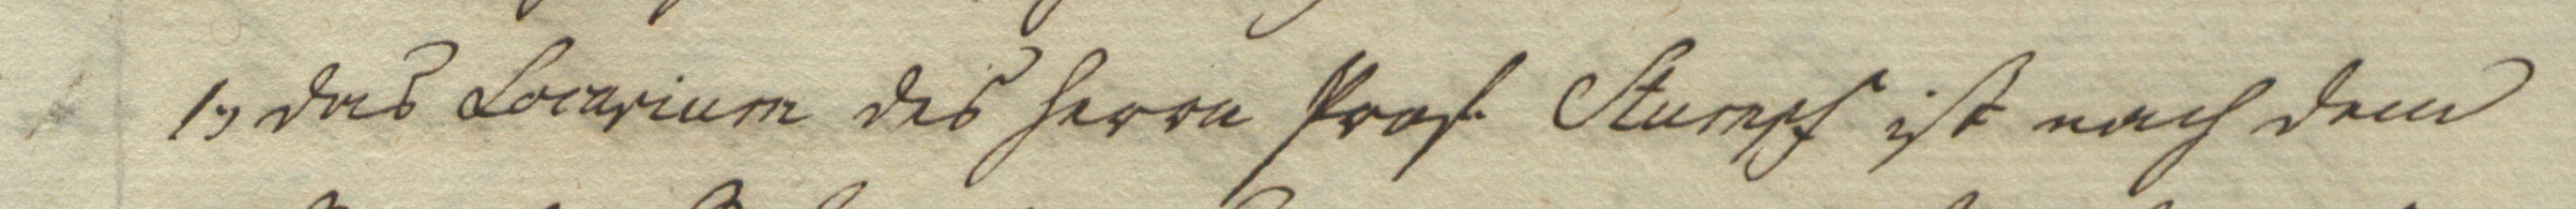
1. das Locarium des Herrn Prof. Stumpf ist nach dem
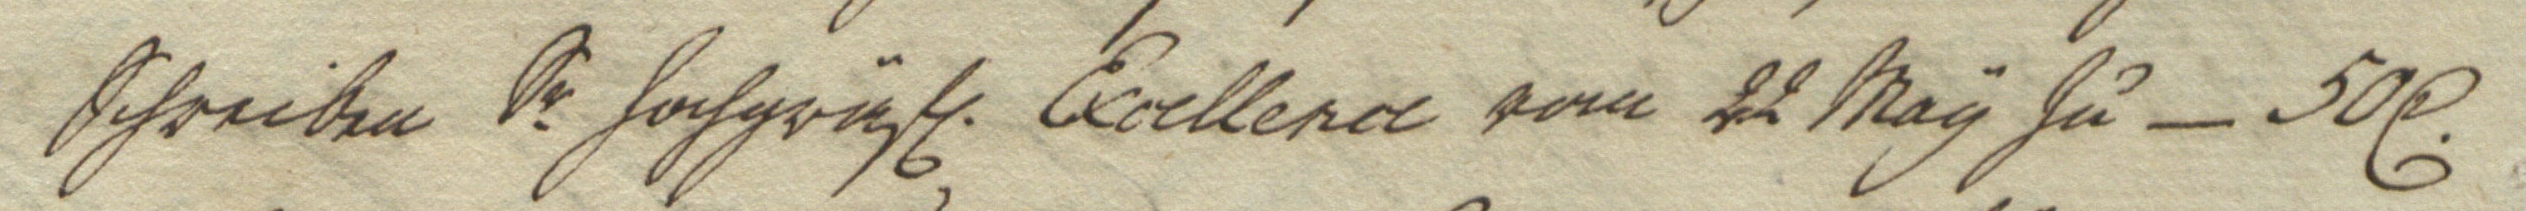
Schreiben Sr. hochgräfl. Excellence vom 22. May zu - 50 rtl.
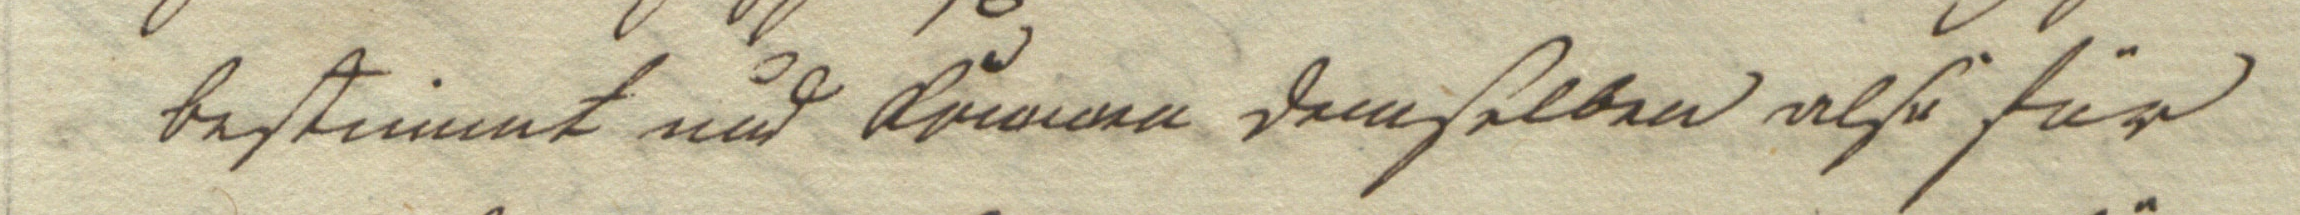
bestimmt und kommen demselben also für
